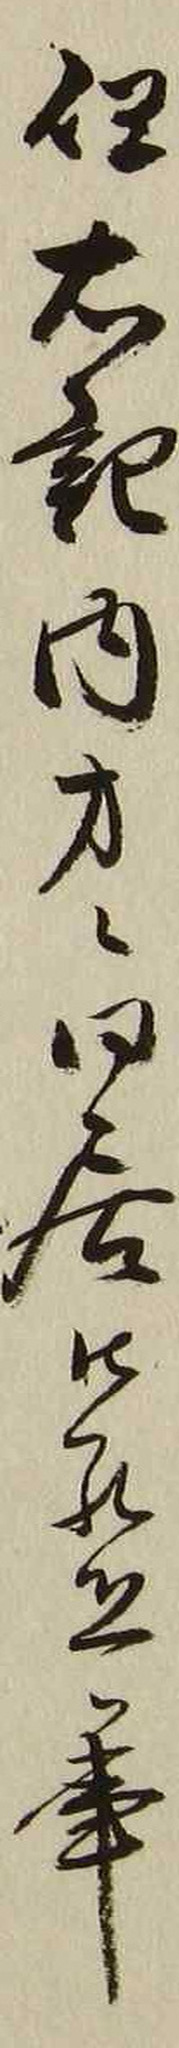但右記内方ニ同居仕罷在候事
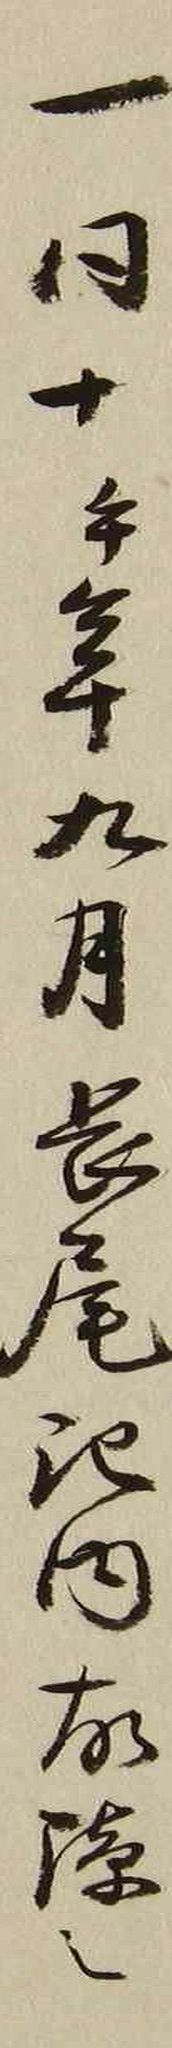一同十午年九月長尾記内故障之
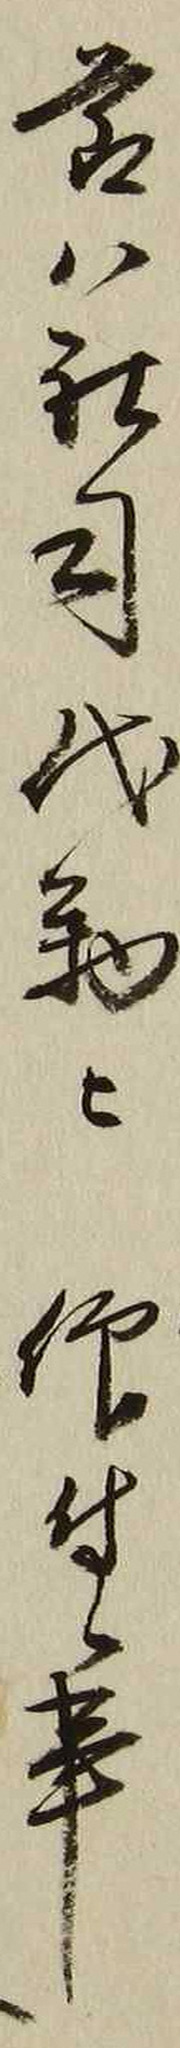節ハ社司代勤被仰付候事
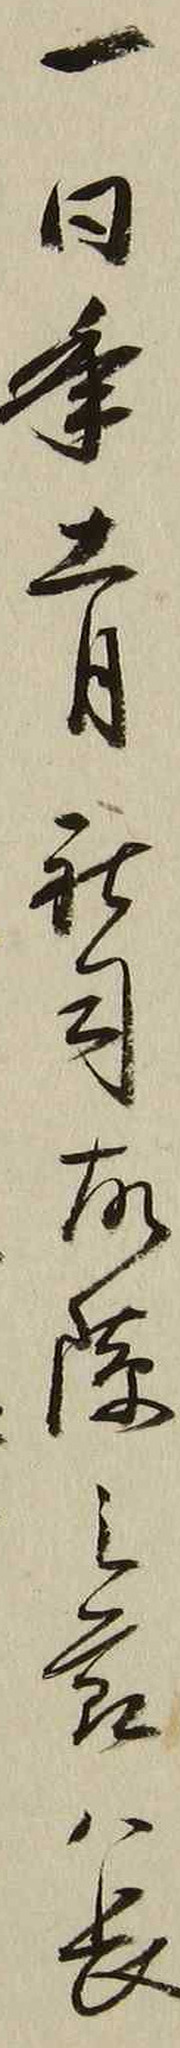一同年十一月社司故障之節ハ長
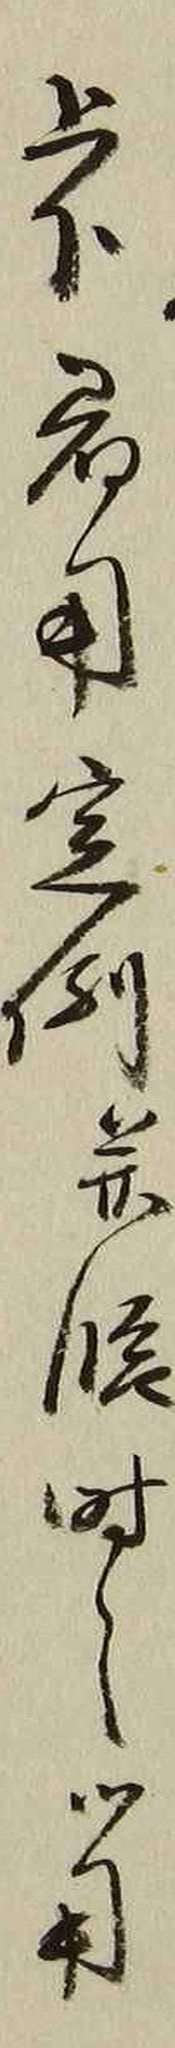上下着用定例并臨時之御用
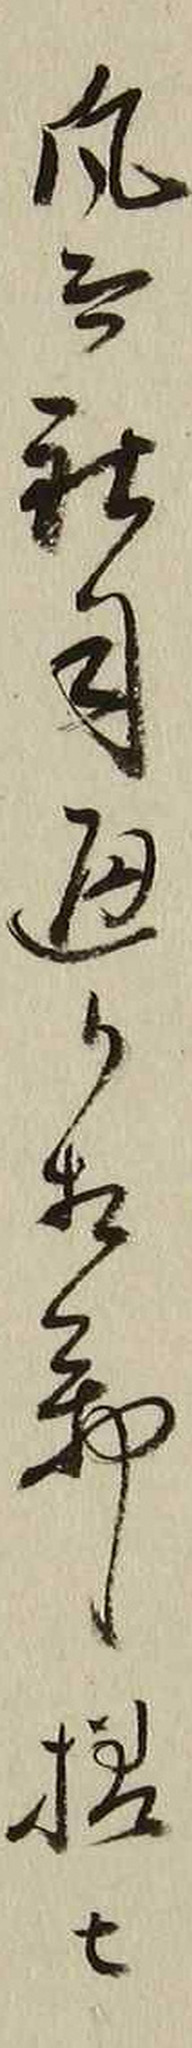凡而社司通り相勤候様被
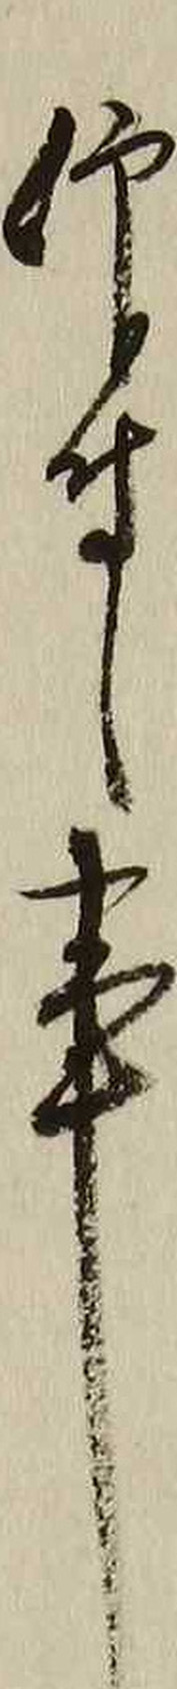仰付候事
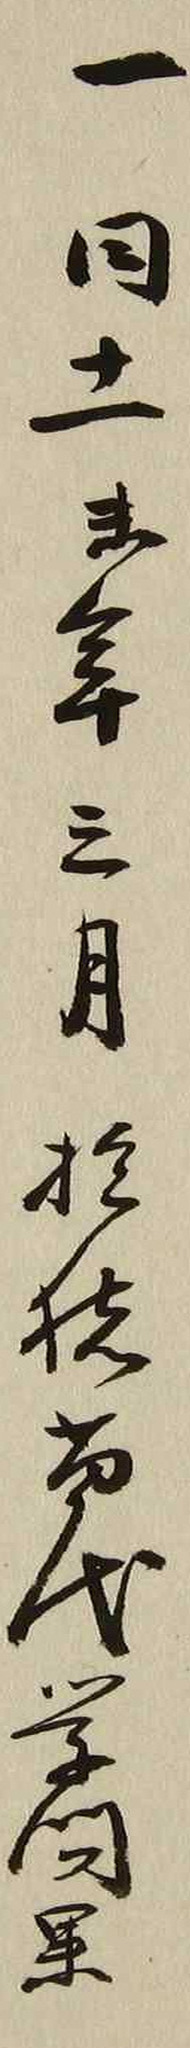一同十一未年三月於猪苗代学問果
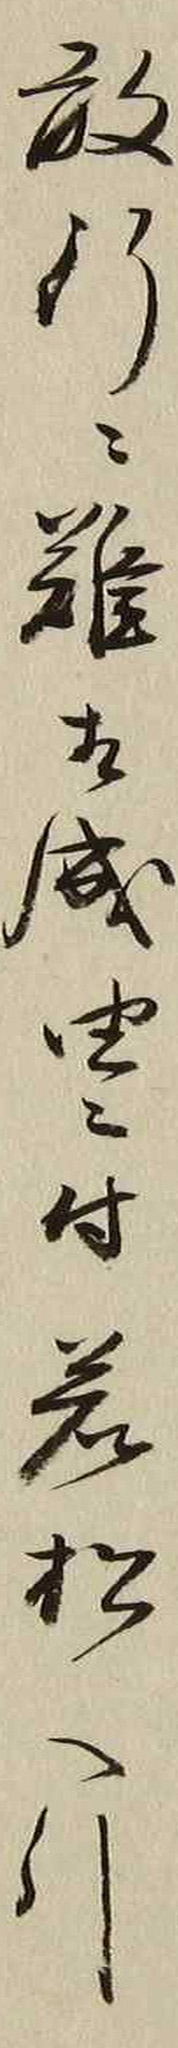敢行ニ難相成由ニ付若松へ引
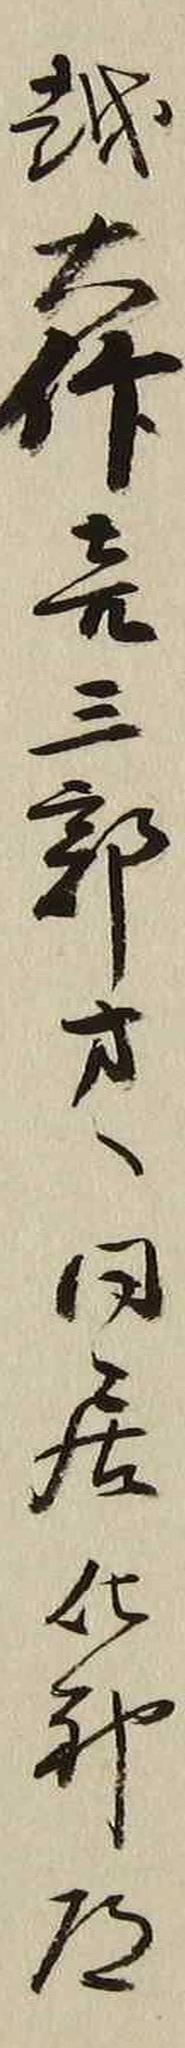越大竹喜三郎方へ同居仕神道
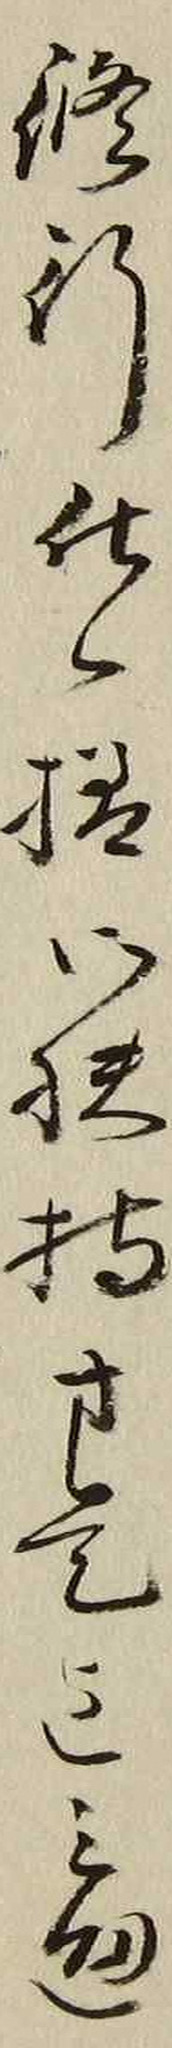修行仕候様御扶持方是迄之通
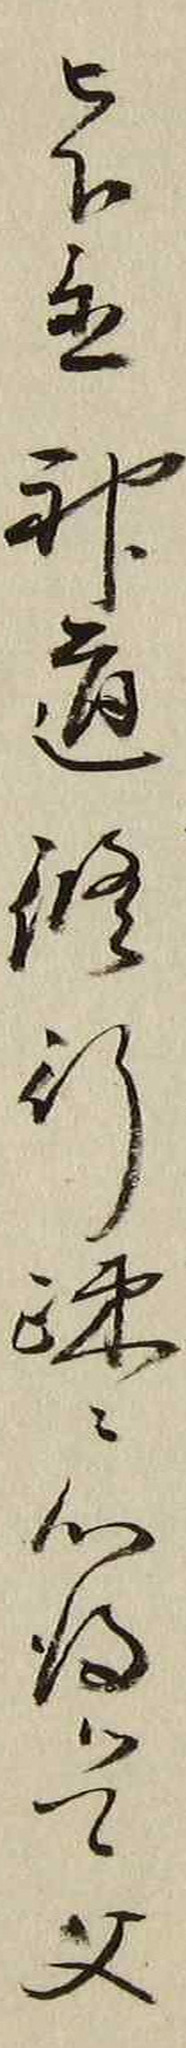被下置神道修行疎ニ心得候ハヽ父
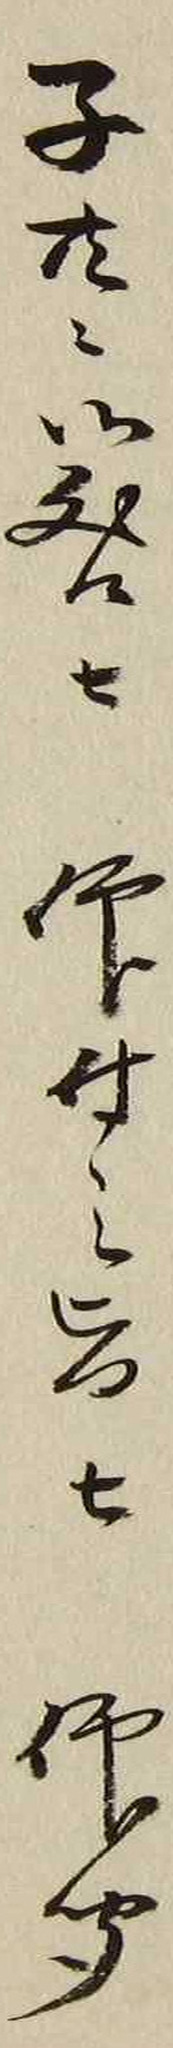子共ニ御咎被仰付之旨被仰聞
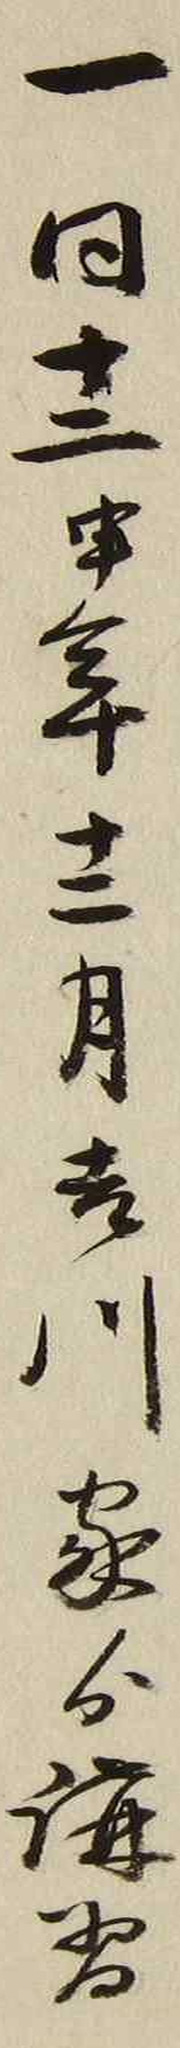一同十二申年十二月吉川家ゟ講習
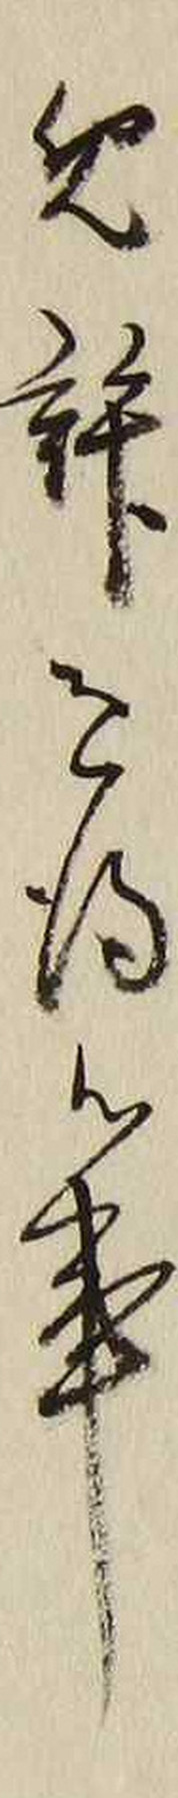免許を得候事
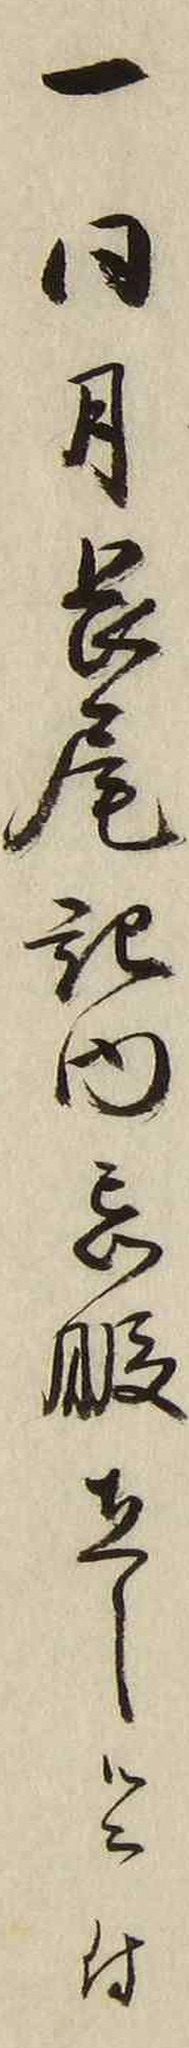一同月長尾記内忌服在之候ニ付
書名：諸士系譜　巻之291　さ之部23
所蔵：会津若松市立会津図書館
